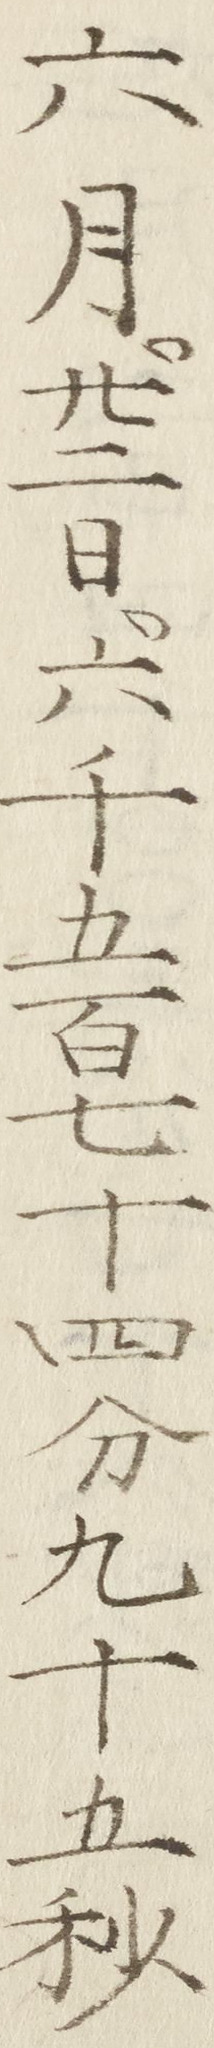六月。廿二日。六撰五百七十四分九十五秒
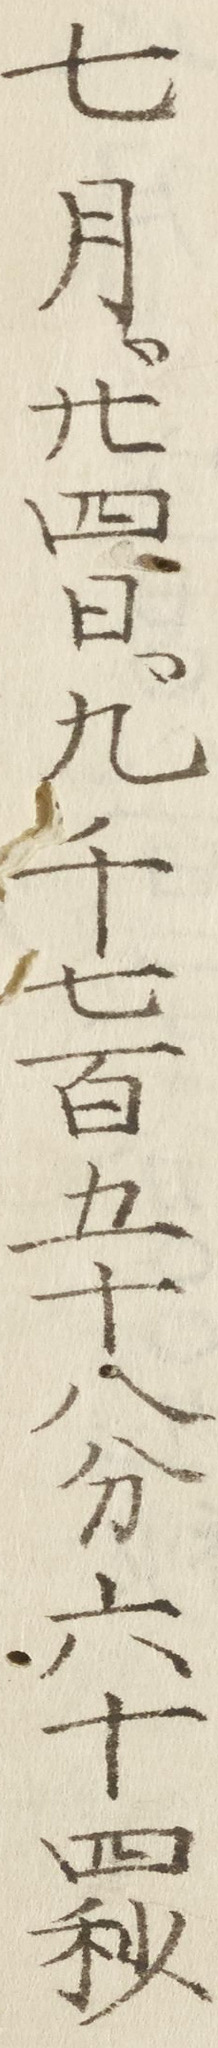七月。廿四日。九千七百五十八分六十四秒

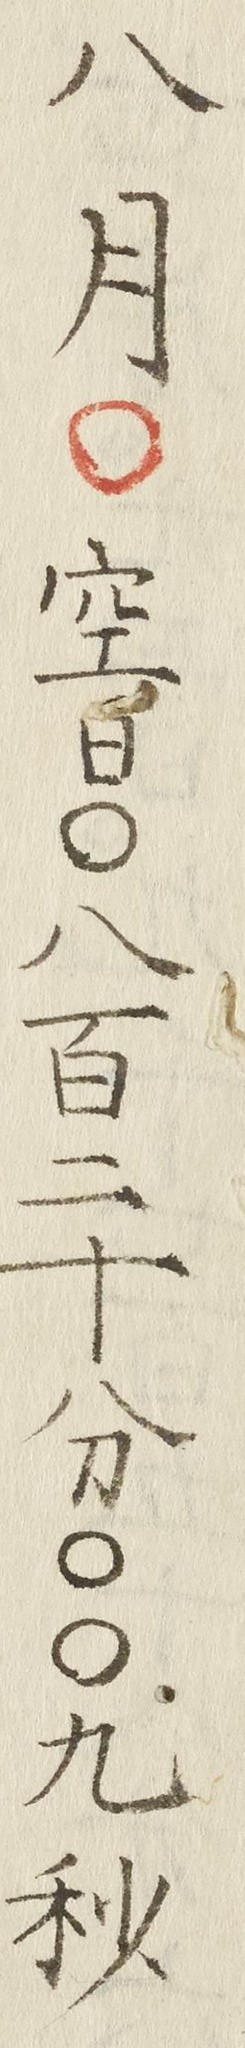八月○空日〇八百二十分〇〇九秒
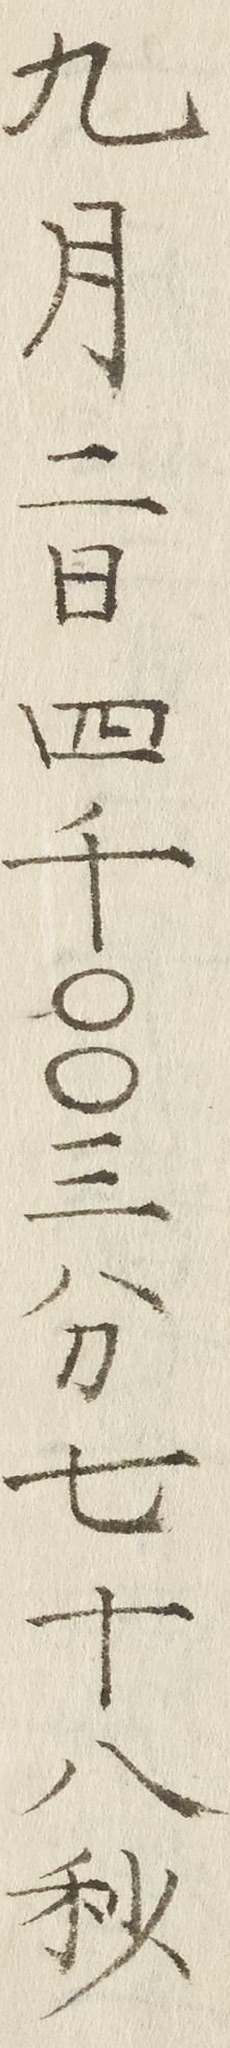九月二日四千〇〇三分七十八秒
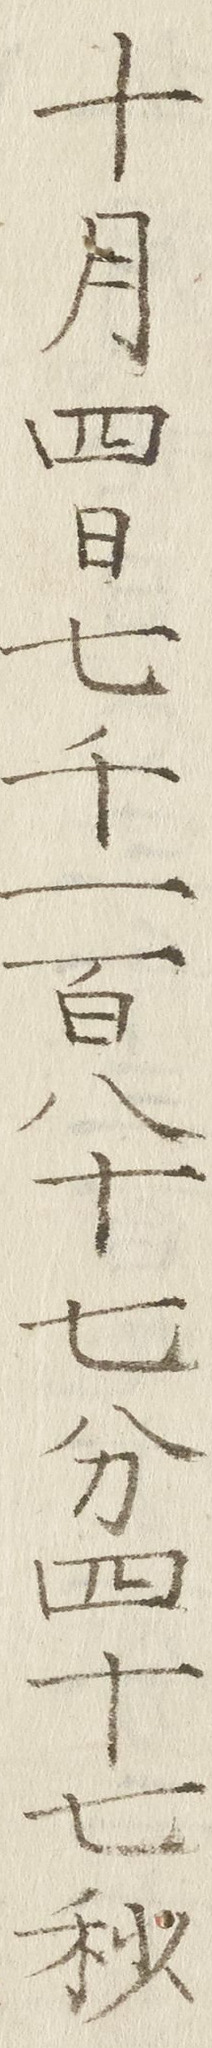十月四日七千一百八十七分四十七秒
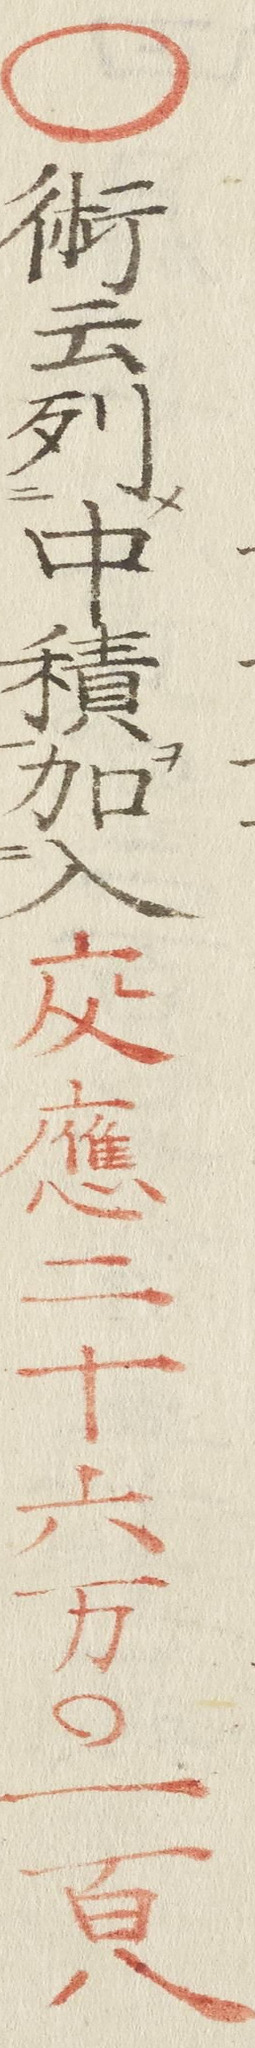○術云列中積加入交応二十六万〇一百八
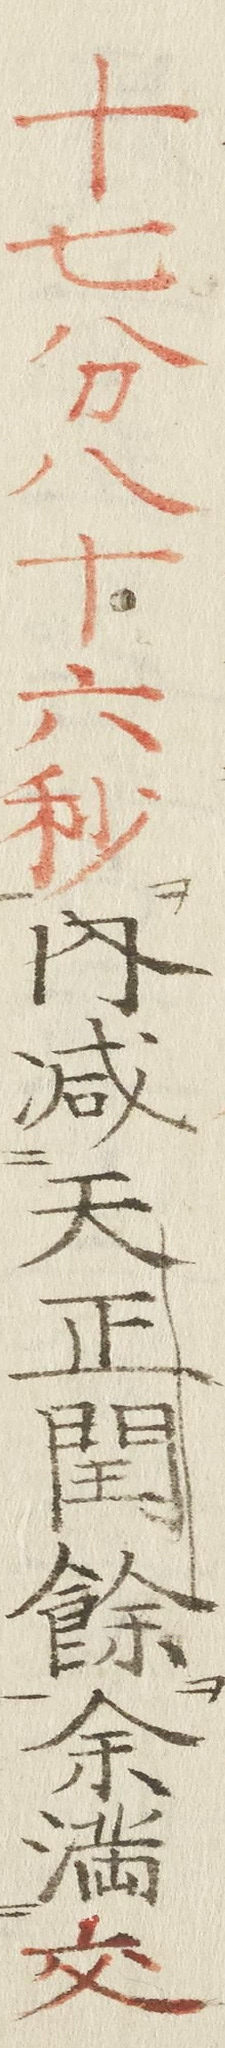十七分八十六秒内減天正閏餘余満交
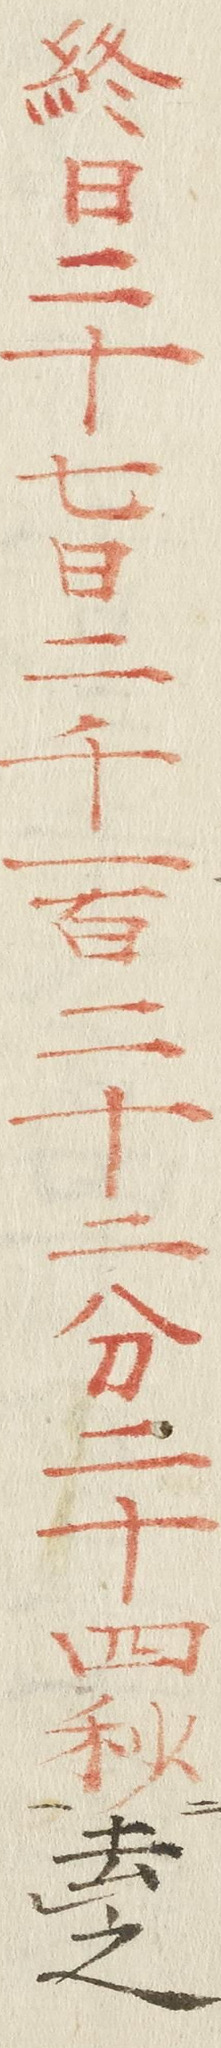終日二十七日二千一百二十二分二十四秒二去之
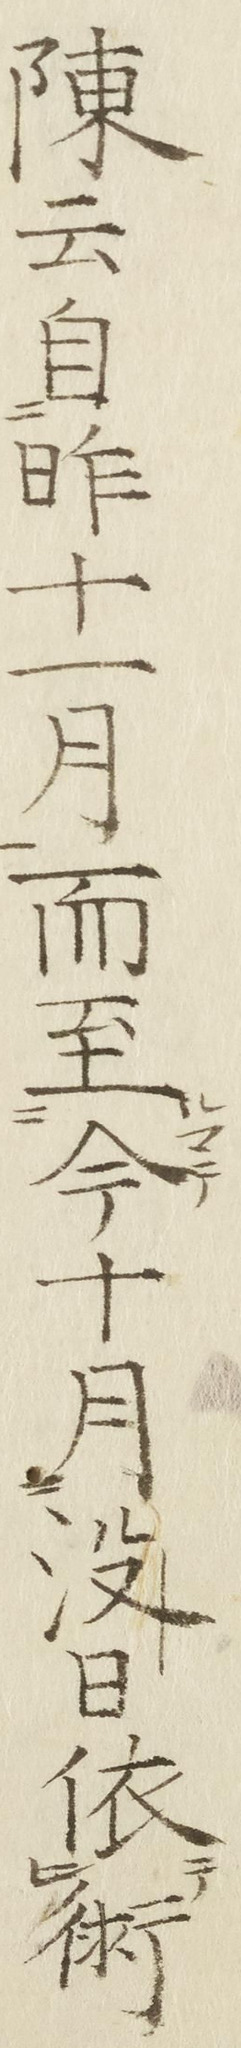陳云自昨十一月而至今十月没日依レ術
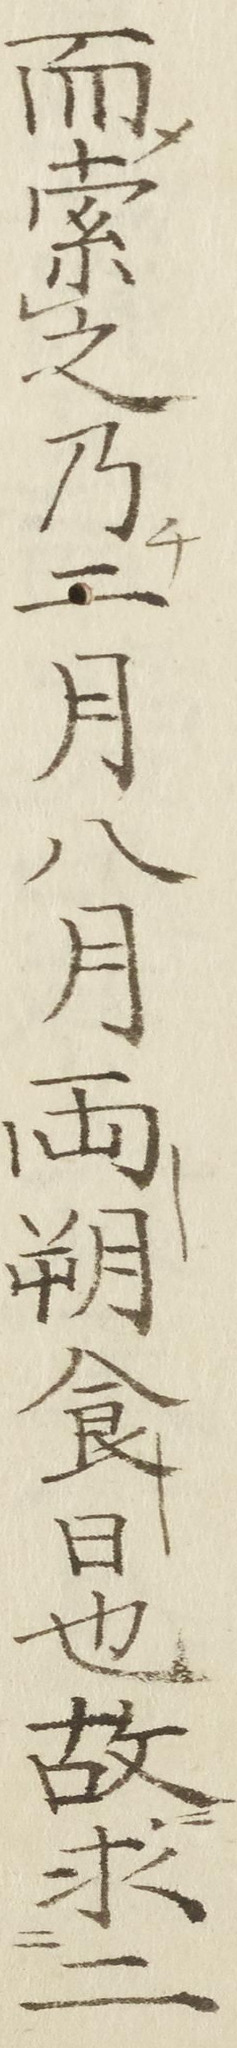而索之乃二月八月両朔食日也故求二
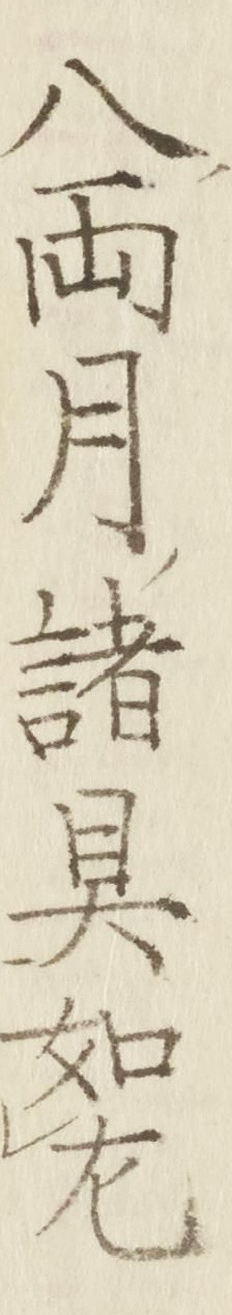八両月諸具如左
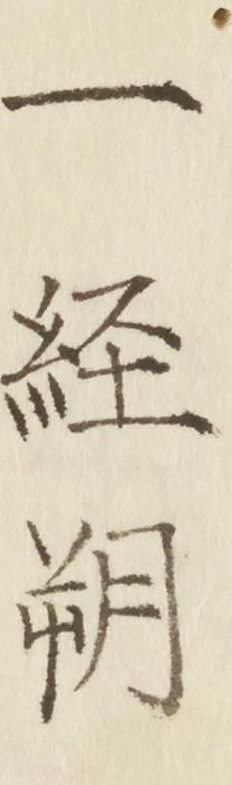一経朔
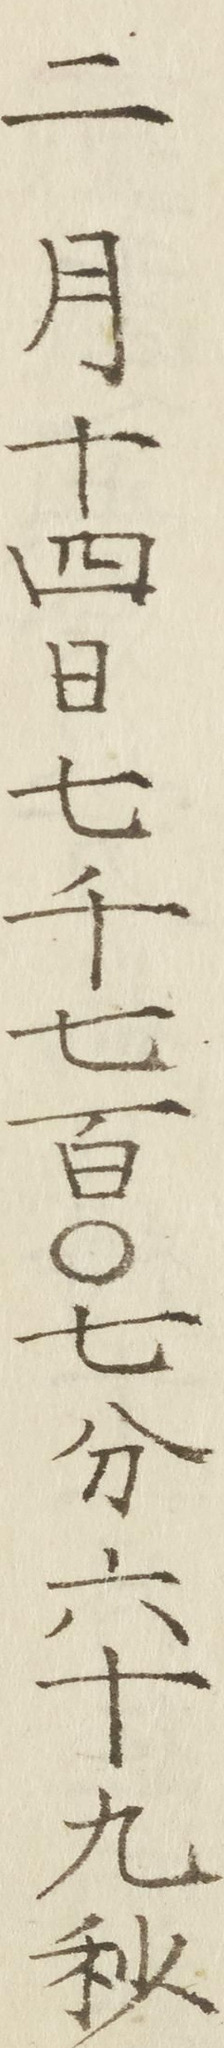二月十四日七千七百〇七分六十九秒
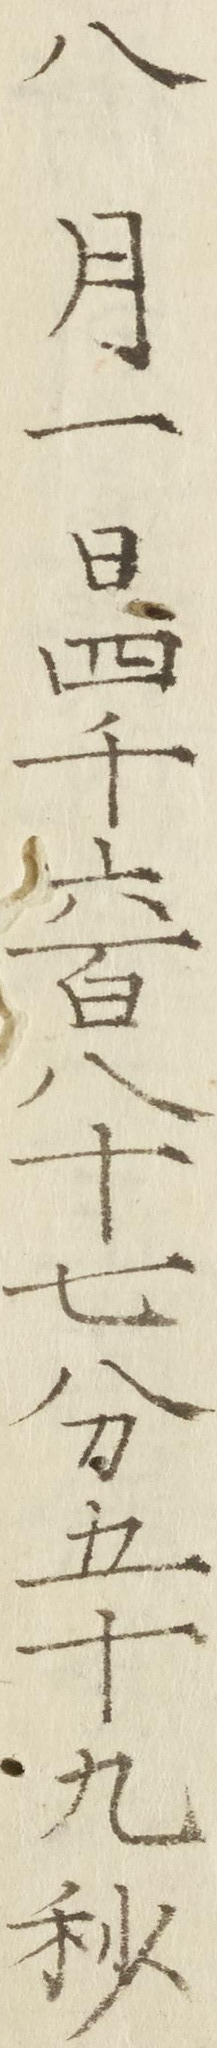八月一日四千六百八十七分五十九秒

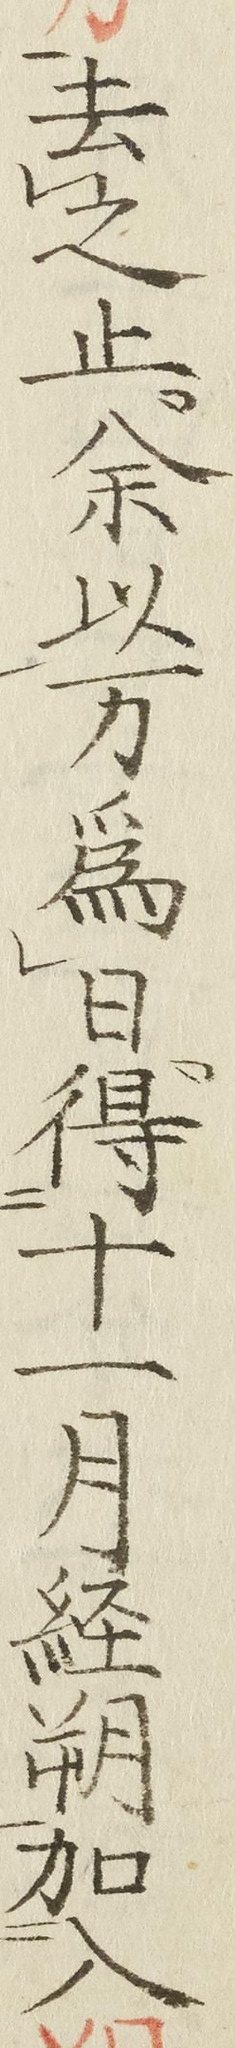万去之止。余以万為日。得十一月経朔加入朔策
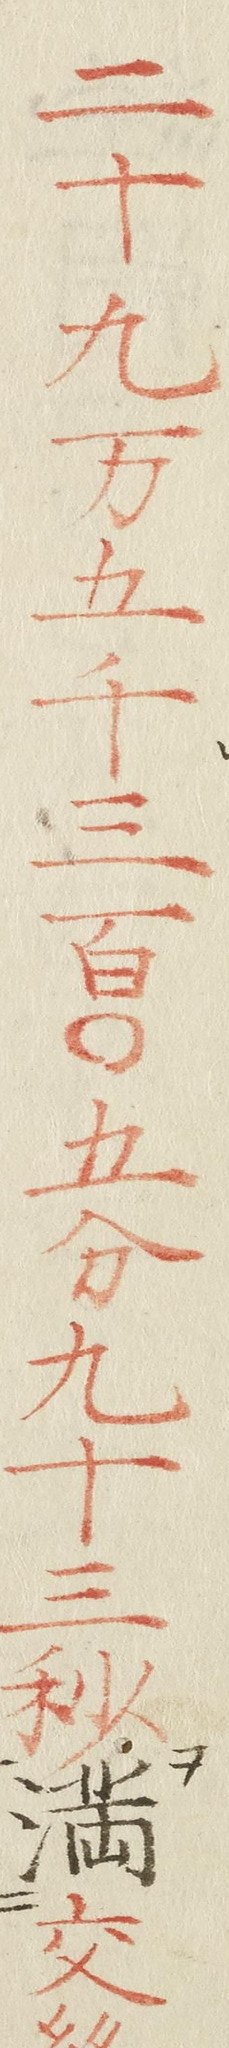二十九万五千三百〇五分九十三秒満交終
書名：日食度
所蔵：東京大学地震研究所図書室 Earthquake Research Institute Library, The University of Tokyo, JAPAN
